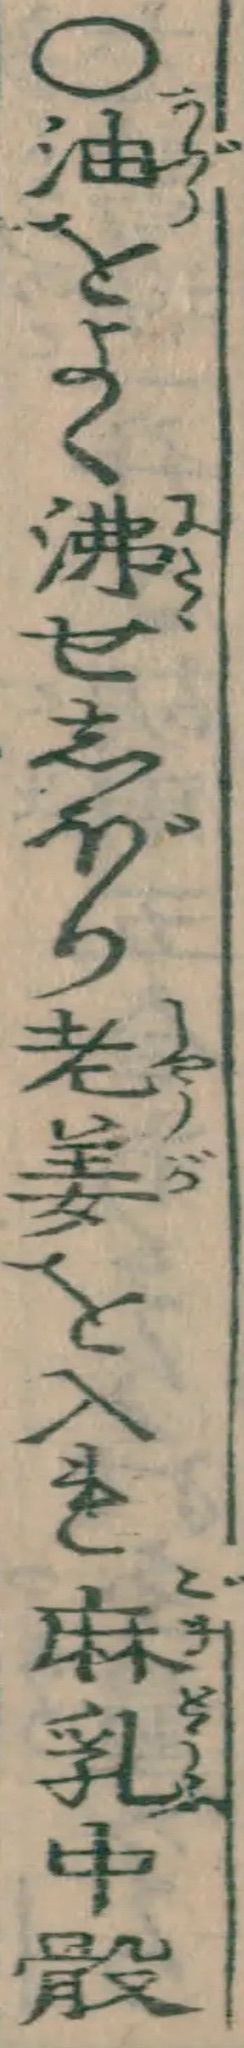○油をよく沸せしぼり老姜を入れ麻乳中骰
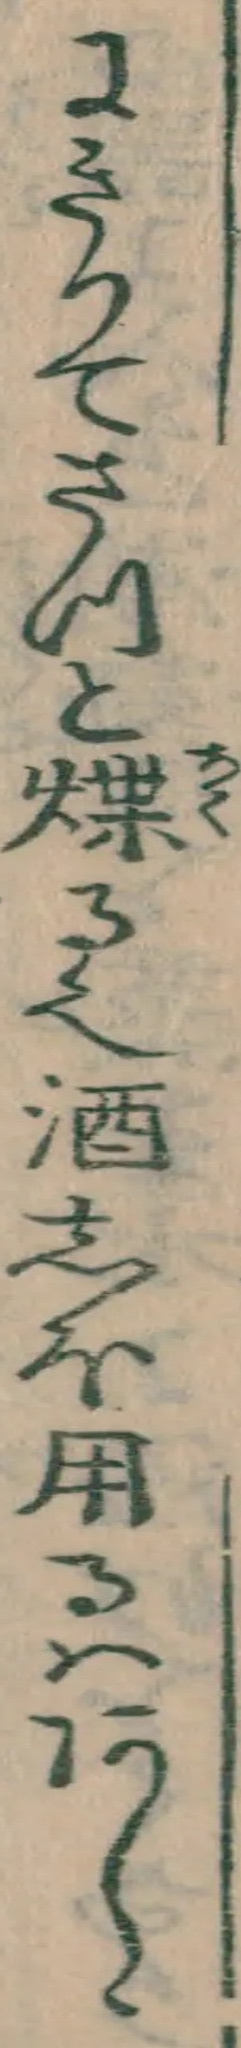にきりてさつと煠る也酒しほ用るはあしゝ
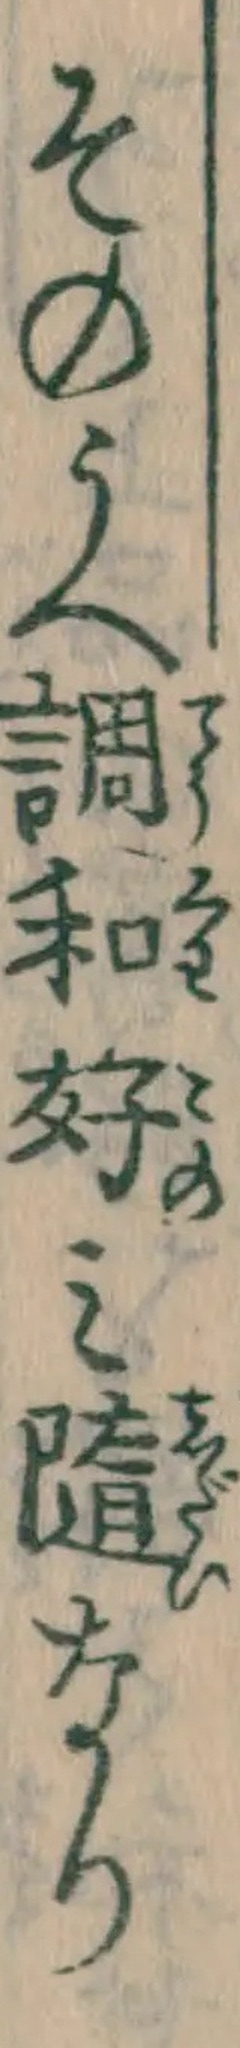そのうへ調和好み随なり
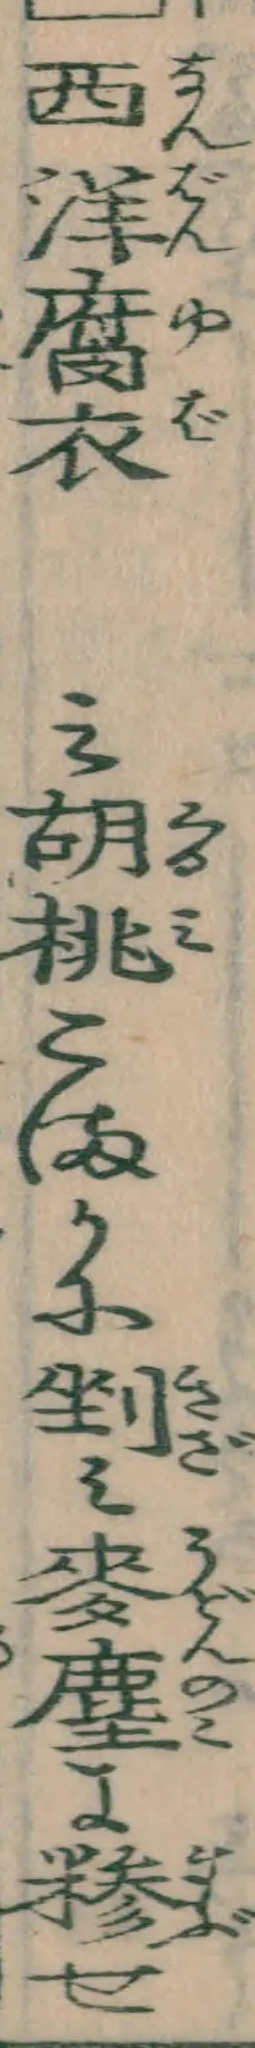六西洋腐衣み胡桃こまかに剉み麦塵に糝せ
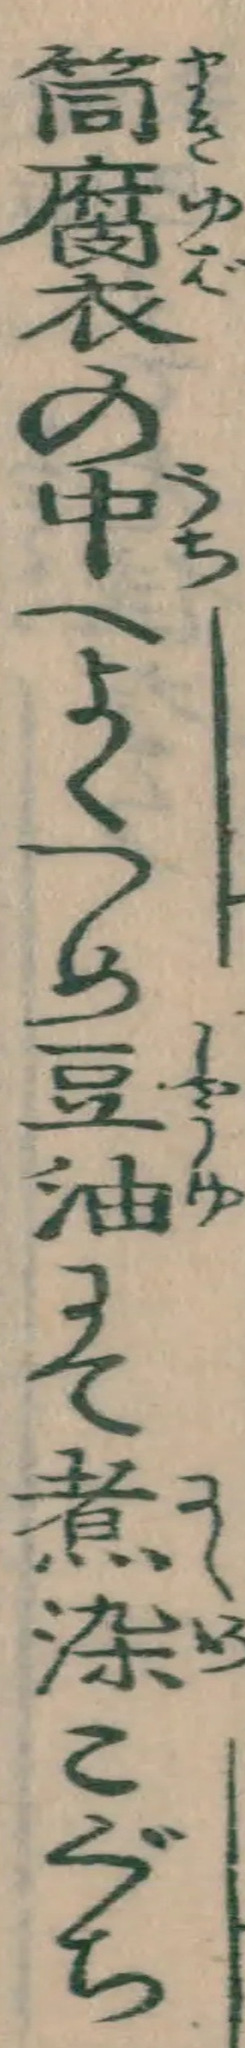筒腐衣の中へよくつめ豆油にて煮染こぐち
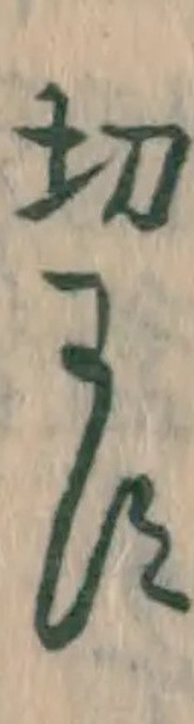切にす
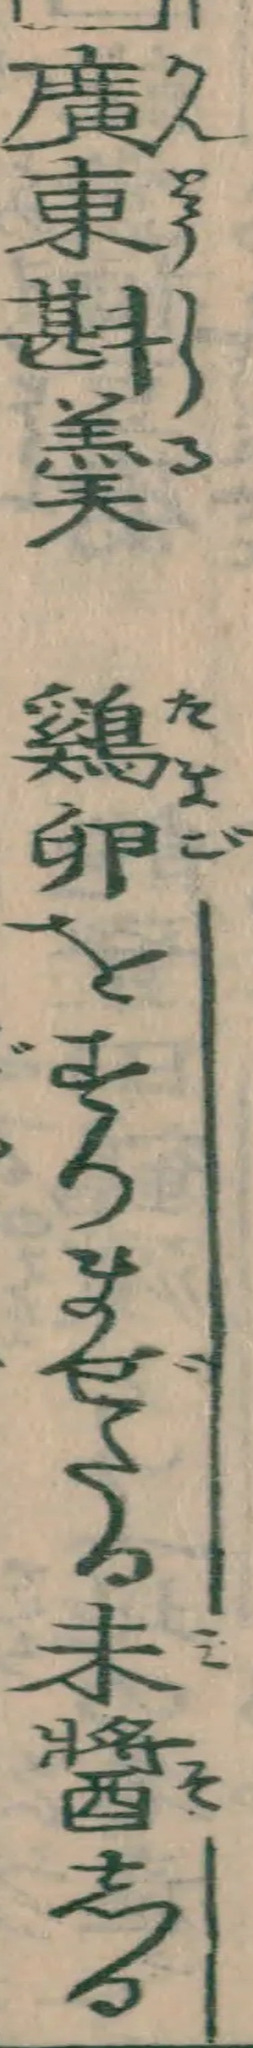七関東斟羹鶏卵をすりまぜたる未醤しる
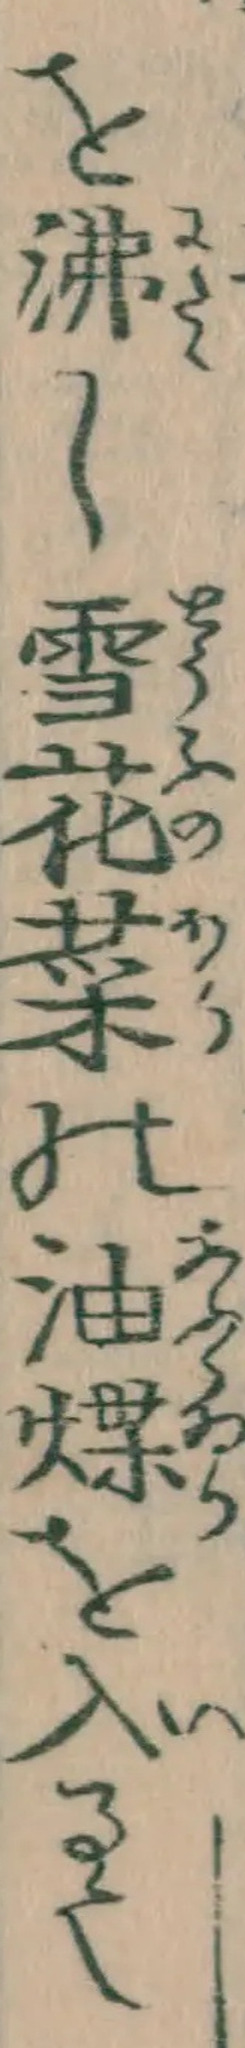を沸し雪花菜の油煠を入る也
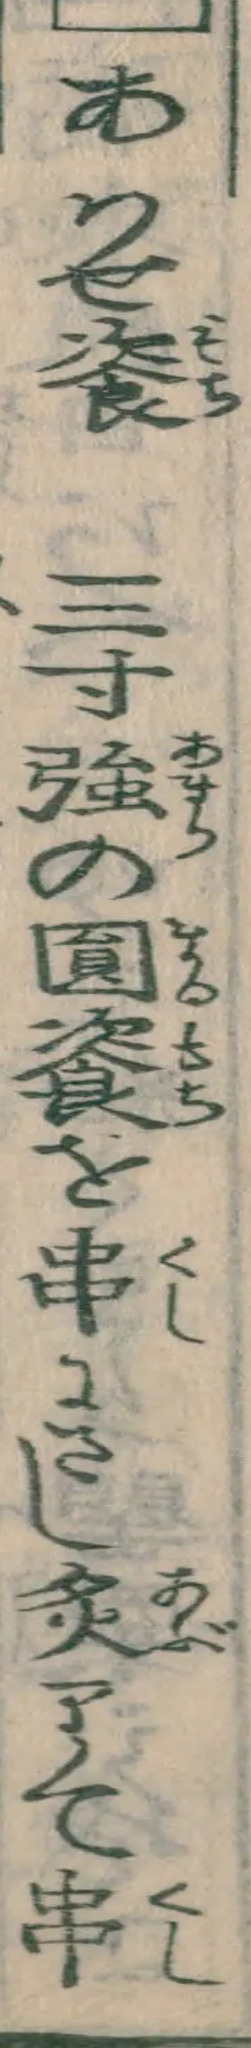八あはせ餈三寸強の円餈を串にさし炙りて串
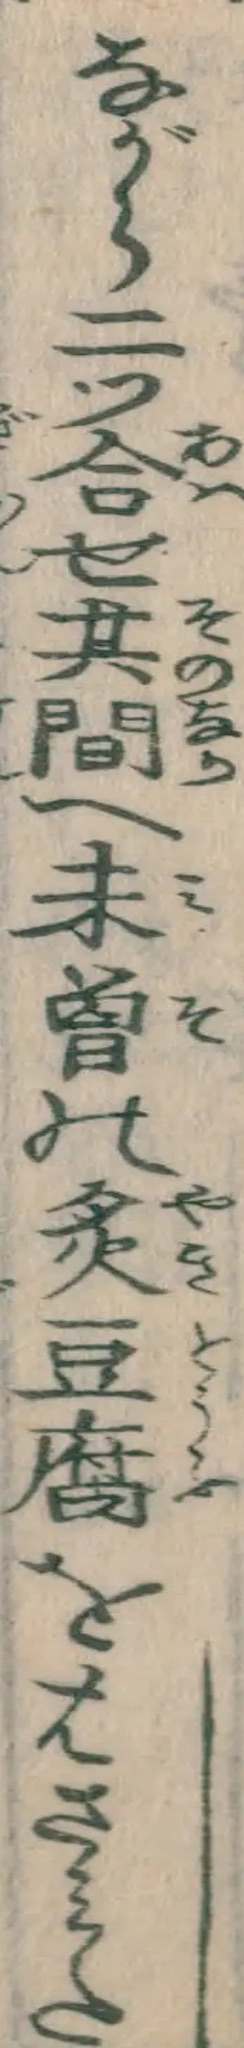ながら二つ合せ其間へ未曽の炙豆腐をはさみた
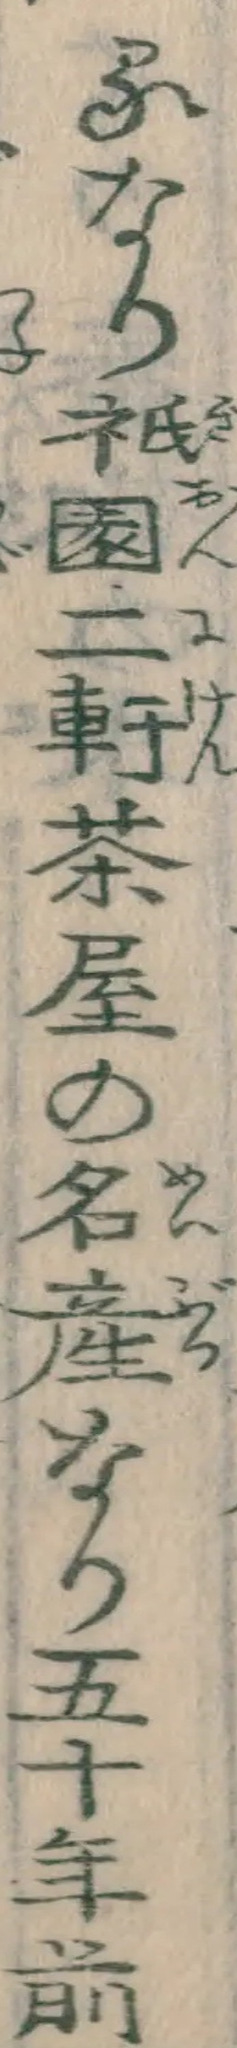るなり祇園二軒茶屋の名産なり五十年前
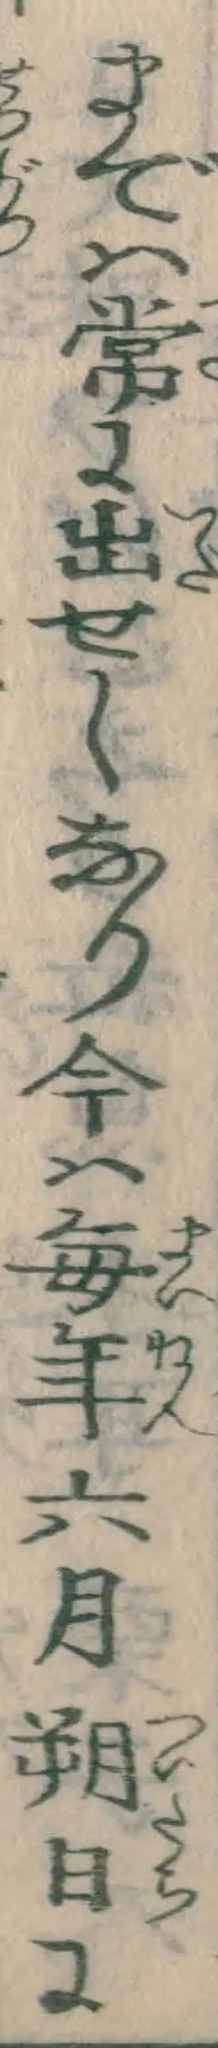までは常に出せしなり今は毎年六月朔日に
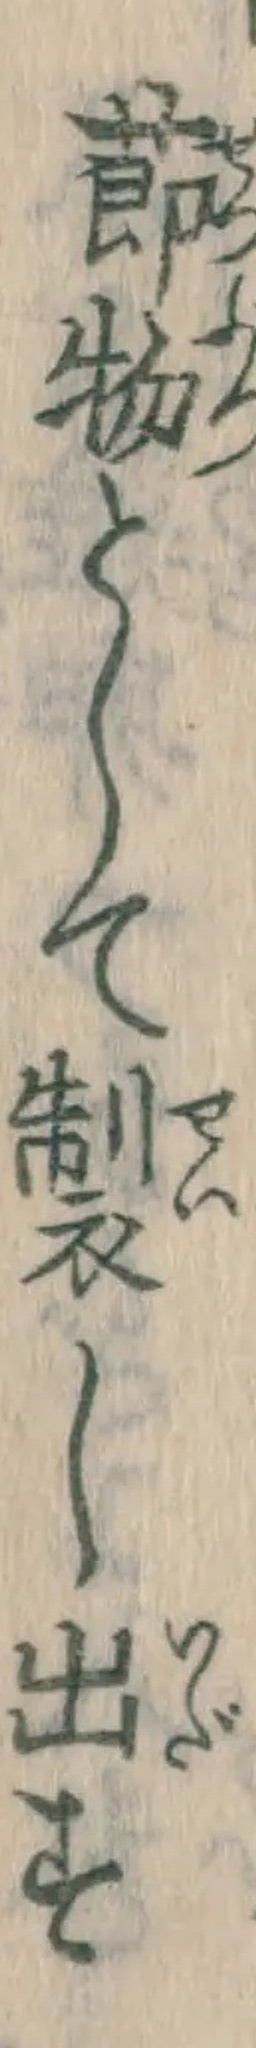節物として製し出す
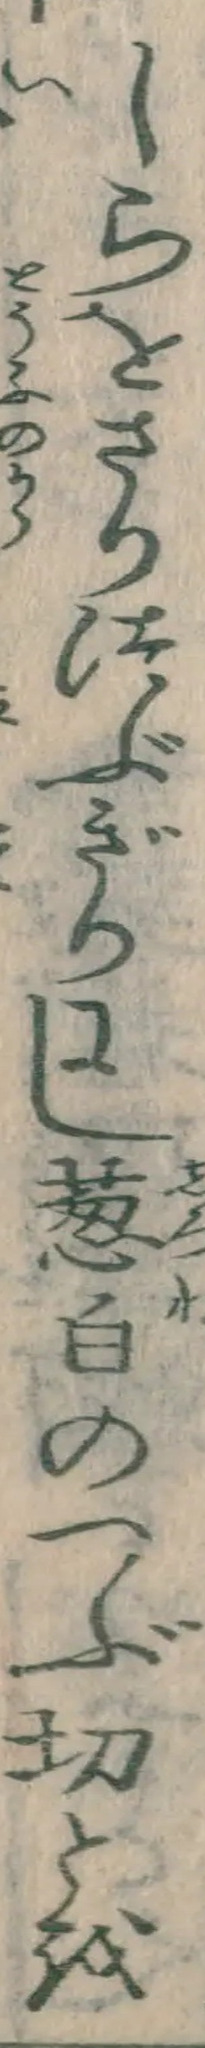しらをさりつぶぎりにし葱白のつぶ切とを
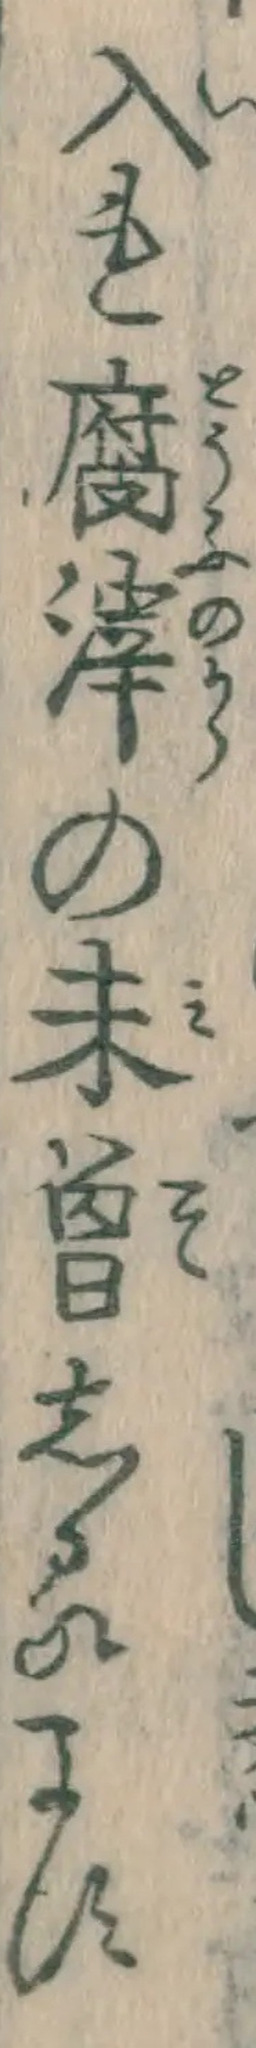入れ腐滓の未曽しるにす

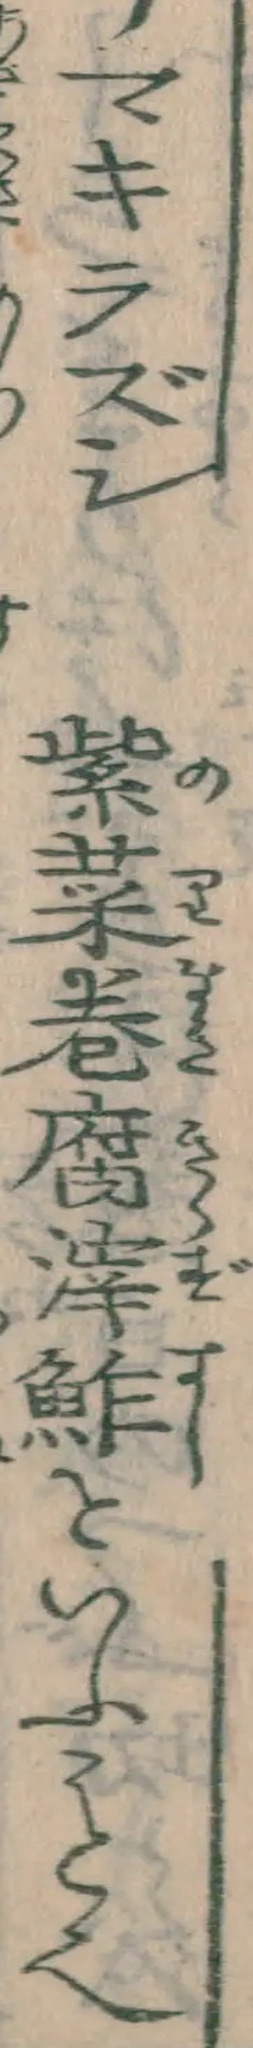十ノリマキラズシ紫菜巻腐滓鮓をいふこと也
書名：豆腐百珍. 続編
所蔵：国立国会図書館 National Diet Library, JAPAN
